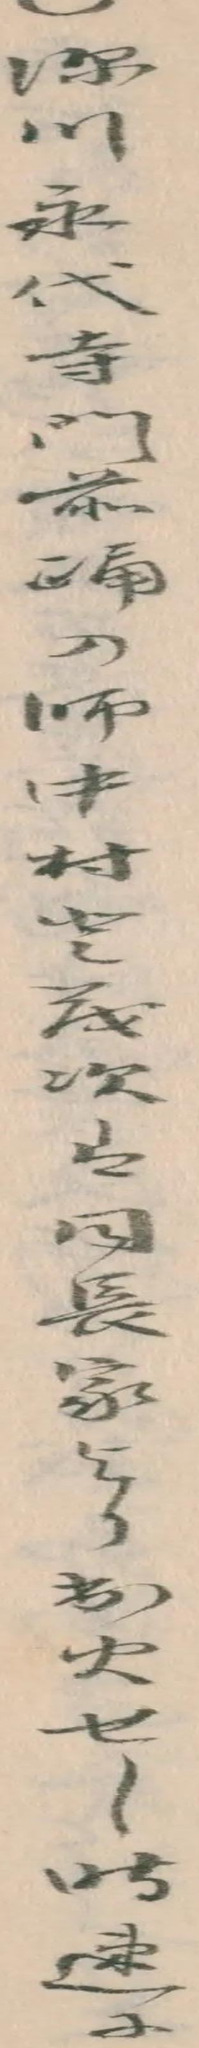〇深川永代寺門前踊の師中村登茂次は同長屋より出火せし時速に
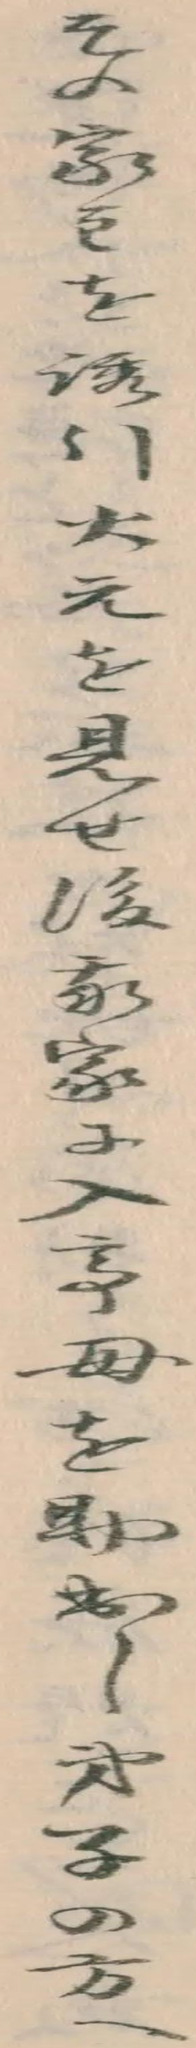その家主を誘引火元を見せ後我家に入て母を助出し弟子の方へ
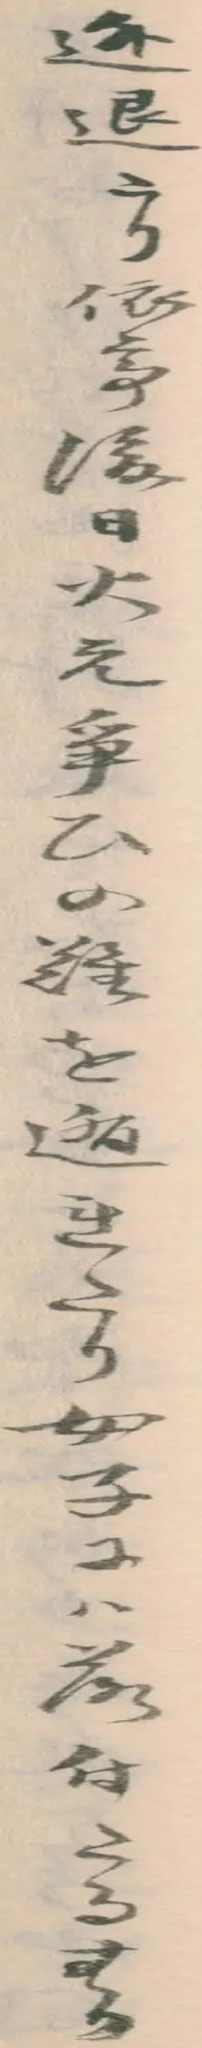逃退たり依て後日火元争ひの難を遁れたり女子には落付たるはか
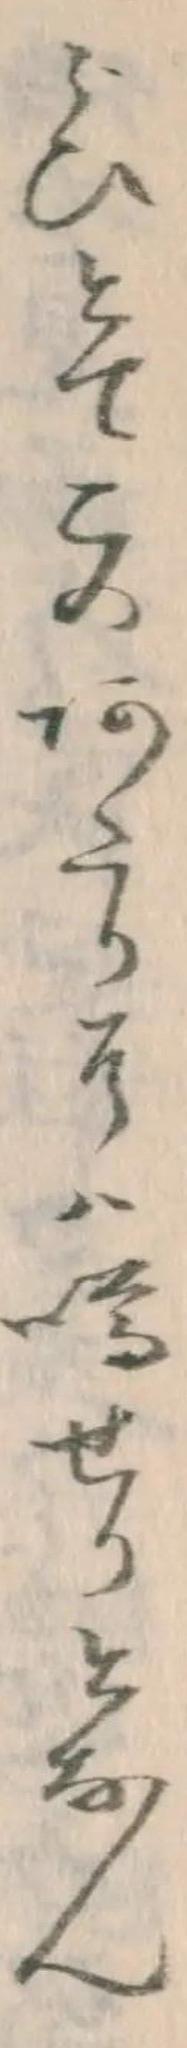らひとてこのあたりには噂せりとなん
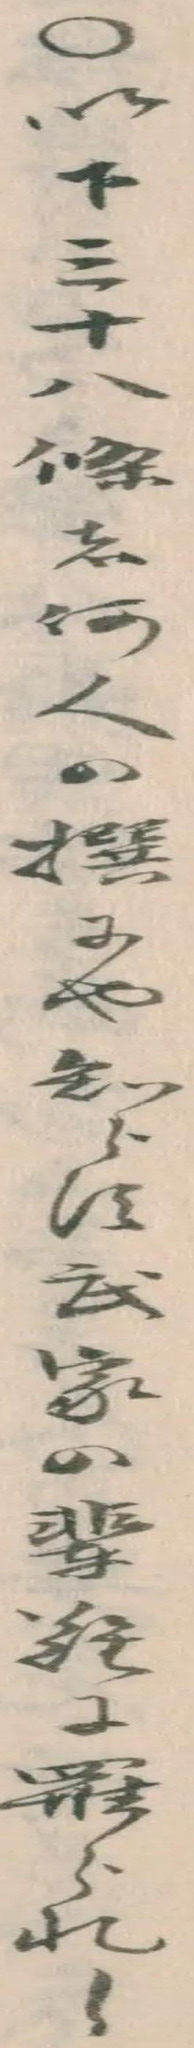〇以下三十八條は何人の撰にや知らす武家の輩難に罹られし
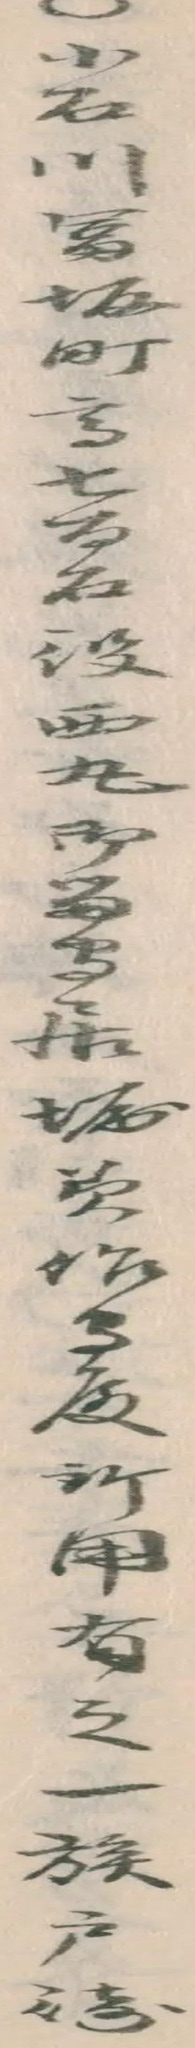〇小石川冨坂町高七百石役西丸御留守居堀美作守殿所用有之一族戸崎
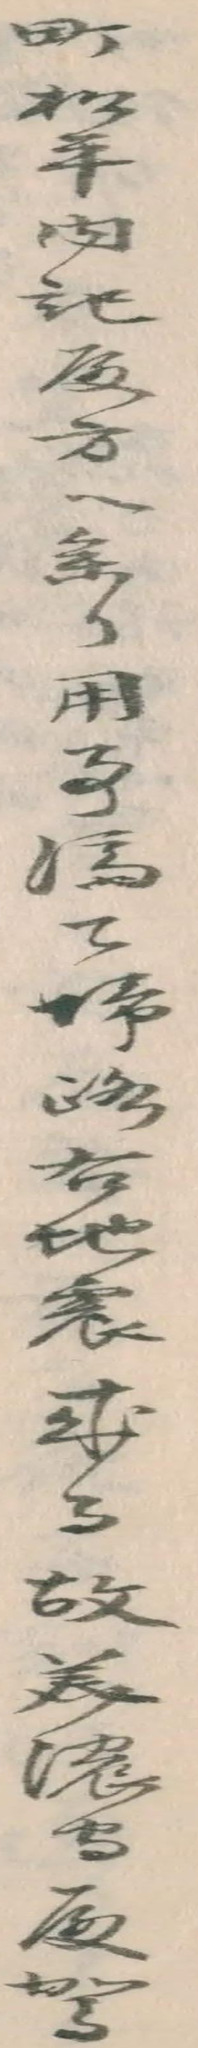町松平内記殿方へ参り用事済て帰路右地震来る故美濃守殿駕
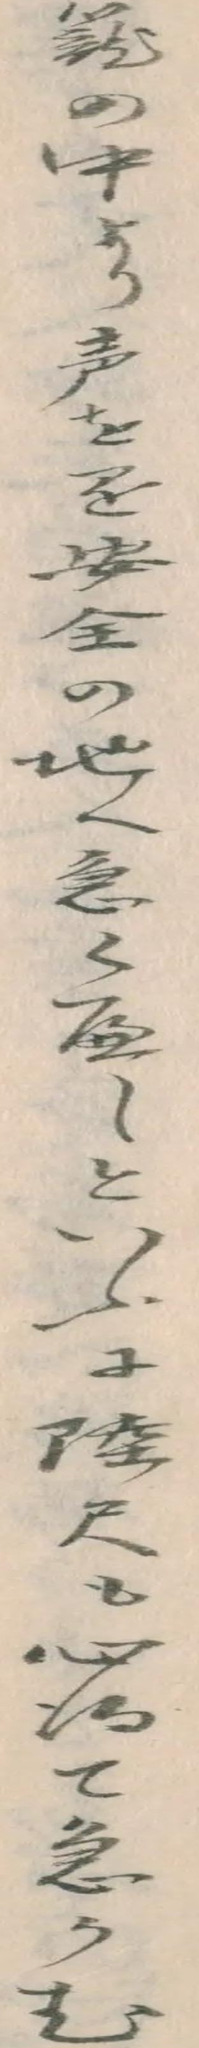籠の中より声を懸安全の地へ急くへしといふに陸尺も心得て急かむ
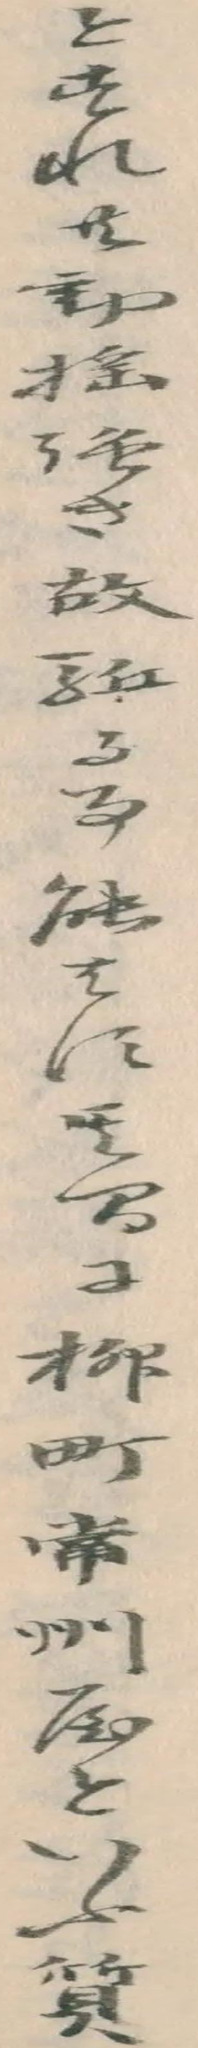とすれ共動揺強き故駈る事能はす其間に柳町常州屋といふ質

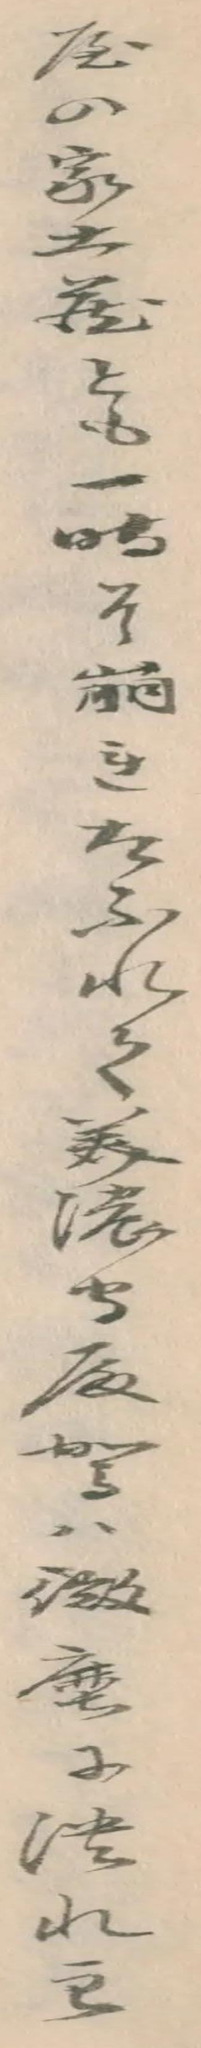屋の家土蔵とも一時に崩れたふれて美濃守殿駕は微塵に潰れ主
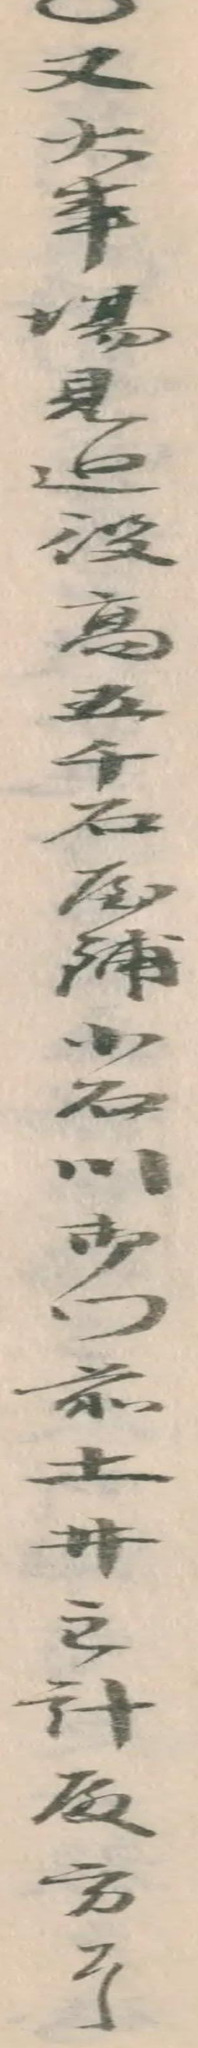〇又火事場見廻役高五千石屋鋪小石川御門前土井主計殿方に
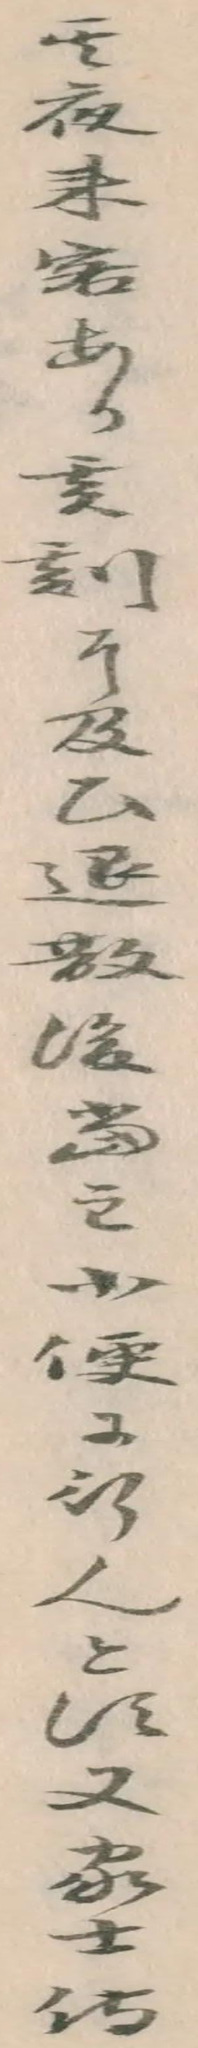其夜来客あり亥刻に及ひ退散後当主小便に行んとす又家士侍
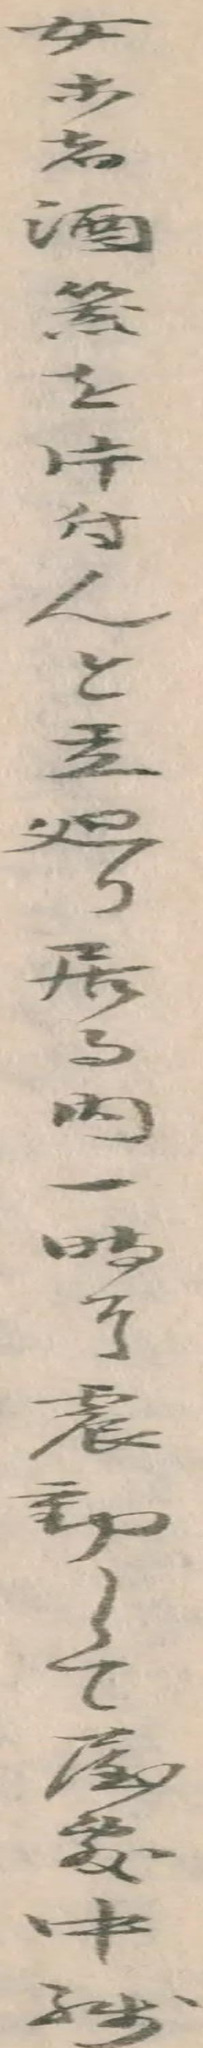女等は酒器を片付んと立廻り居る内一時に震動して屋敷中残
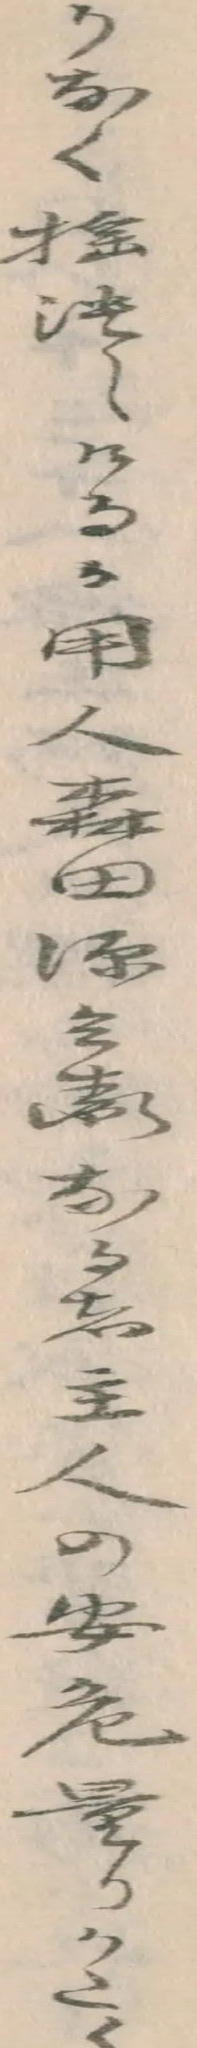りなく揺潰しけるか用人森田源兵衛なる者主人の安危量りかたく
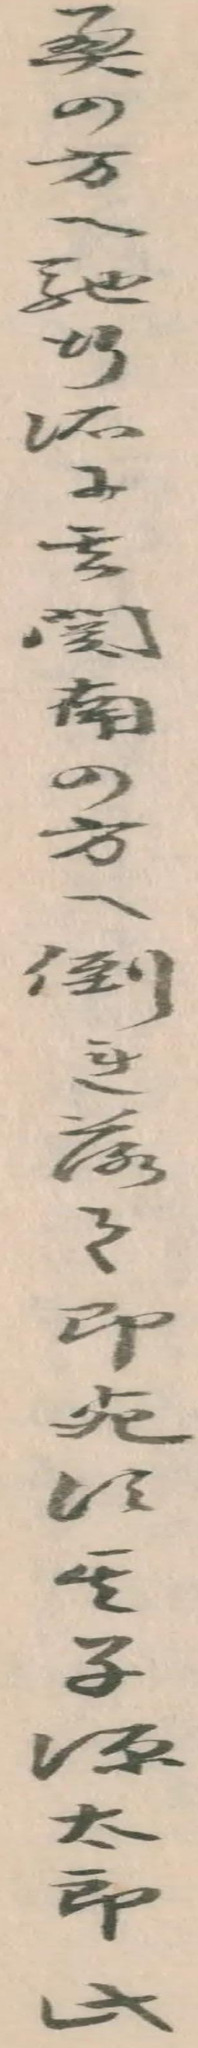奥の方へ馳行所に玄関南の方へ倒れ落て即死す其子源太郎此
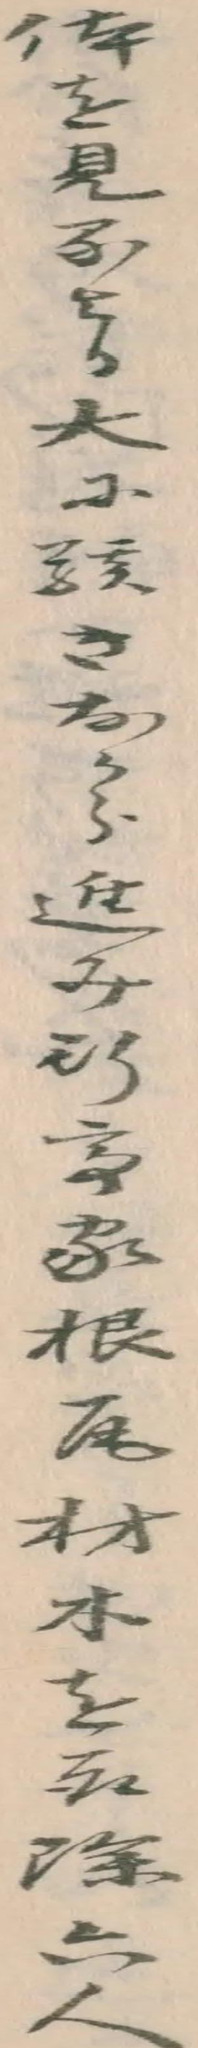体を見るより大に駭きなから進み行て家根瓦材木を取除六人
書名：地災撮要. 巻10(地震之部) 上,下
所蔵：国立国会図書館 National Diet Library, JAPAN
